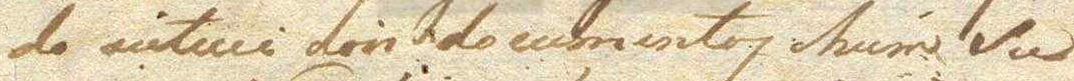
do autuei dois documentos hum Su
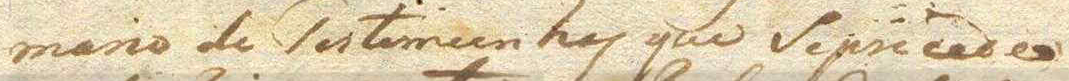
mario de Testemunhas que Se precedeo
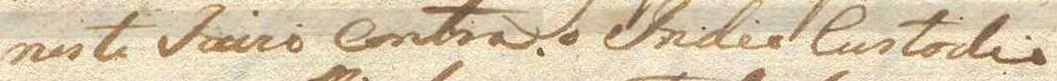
neste Iuizo contra o Indio Custodio
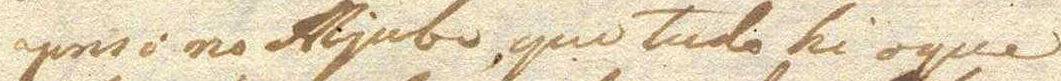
preso no Aljube, que tudo hé o que
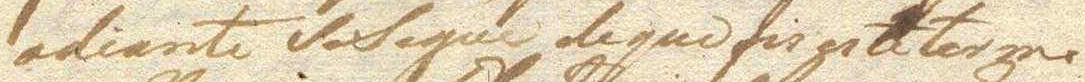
adiante Se Segue de que fiz este termo
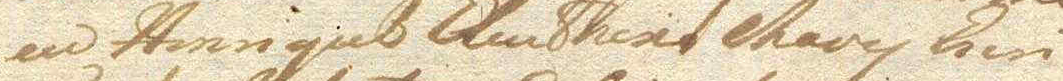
eu Henrique Eleutherio Chaves Escri
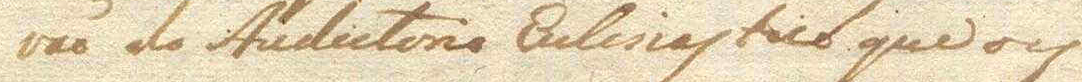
vaõ do Audictorio Ecclesiastico que o es
